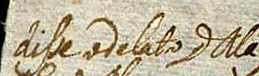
disse o delato q̄ Ma
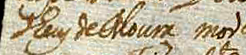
theus de Moura mor
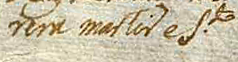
rera martir e s.to
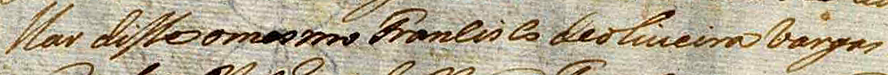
llar disse o mesmo Francisco de oliueira vargas
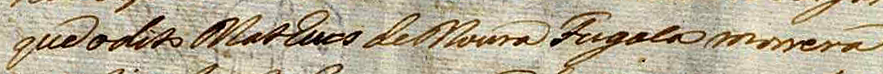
que o dito Matheus de Moura Fugaça morrera
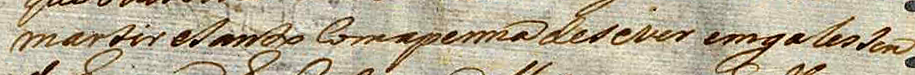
martir e santo com a penna de se ver em gales sen
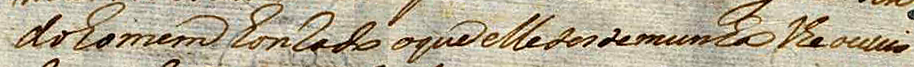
do homem honRado o que elle testemunha lhe ouuio
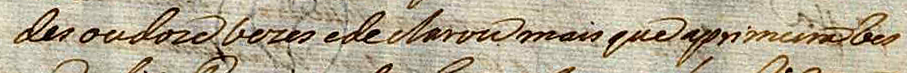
des ou doze vezes e declarou mais que a primeira ves
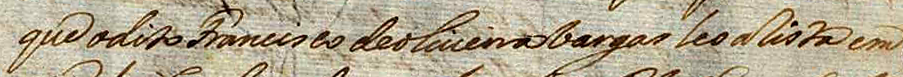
que o dito Francisco de oliueira vargas leo a lista em
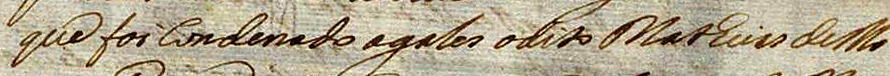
que foi Condenado a gales o dito Matheus de Mo
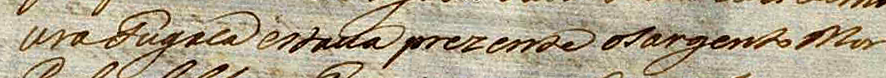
ura Fugaça estaua prezente o sargento Mor
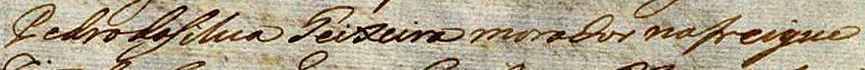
Pedro da Silua Teixeira morador na freigue
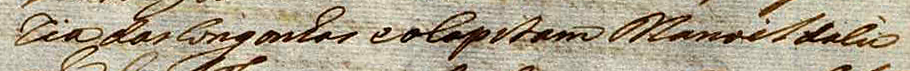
Zia das congonhas e o Capitam Manoel da Cu
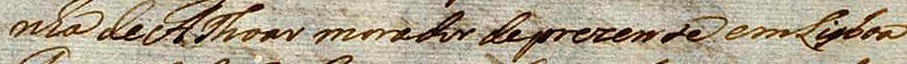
nha de Athoar morador de prezente em Lisboa
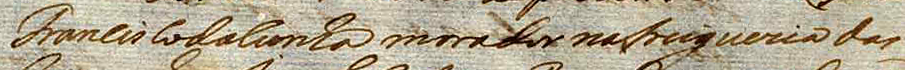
FrancisCo da Cunha morador na freiguezia das
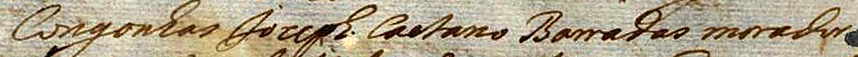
Congonhas Jozeph Caetano Barradas morador
